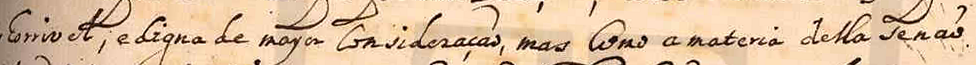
horrivel, e digna de mayor Consideraçaõ, mas Como a materia della se naõ
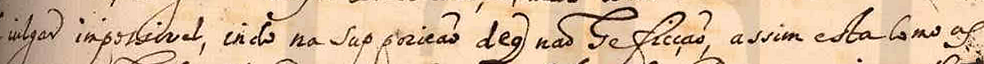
iulgar impossivel, indo na suppozição de q̄ naõ he ficçaõ, assim esta como as
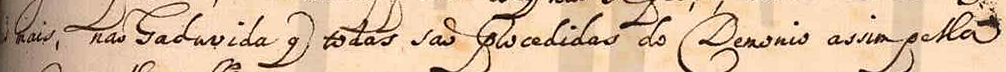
mais, naõ ha duvida q̄ todas saõ pRocedidas do Demonio assim pella
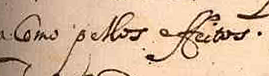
Como pellos effeitos.
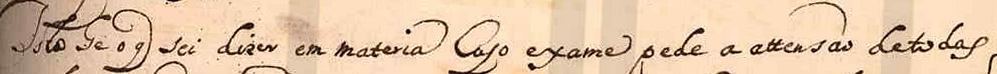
Isto he o q̄ sei dizer em materia Cujo exame pede a attensaõ de todas
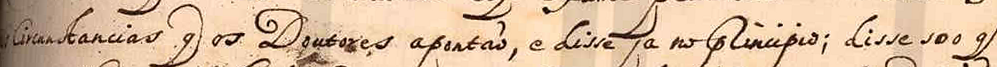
Circunstancias q̄ os Doutores apontaõ, e disse ja no pRincipio, disse soo q̄
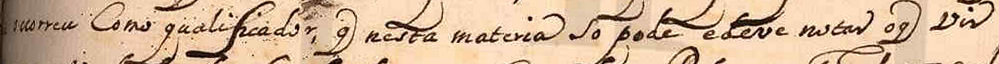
morreu Como qualificador, q̄ nesta materia so pode, e deve notar o q̄ vir
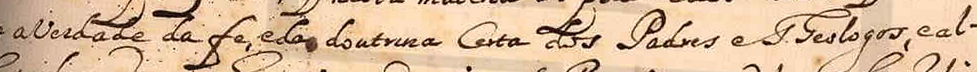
a Verdade da fe, e da doutrina Certa dos Padres, e Theologos, e al
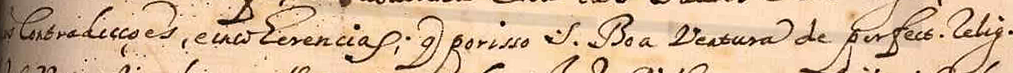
Contradicçoẽs, e incoherencias, q̄ por isso S. Boa Ventura de perfecs. Relig.
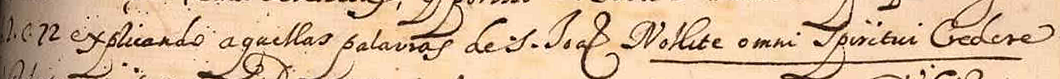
C. 72 explicando aquellas palavras de S. Ioaõ Nollite omni spiritui Credere
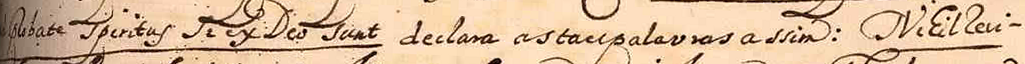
probate spiritus se ex Deo sunt declara as taes palavras assim: Nihil Resi
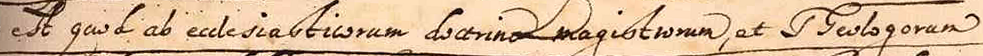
est quod ab ecclesiasticorum doctrina magistrorum, et Theologorum
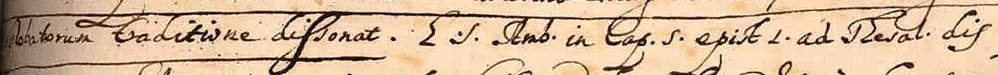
Robatorum traditione dissonat. E S. Amb. in Cap. 5. epist 1. ad Thesal. dis
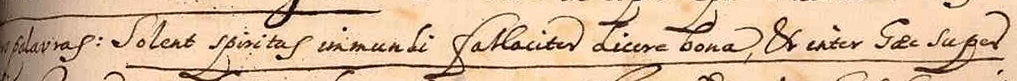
palavras: Solent spiritus immundi fallaciter dicere bona, & inter hæc super
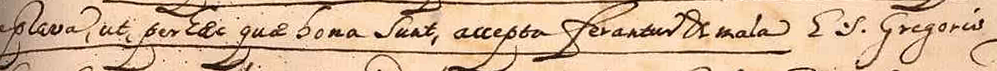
pRava, ut per hæc quæ bona sunt, accepta ferantur & mala E S. Gregorio
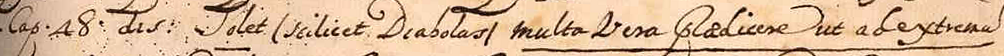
Cap. 48. dis: Solet (scilicet Diabolus) multa vera pRædicere ut ad extremū
